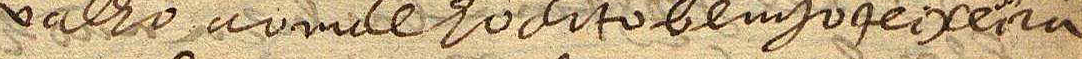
valho aomde ho dito bemto teixeira
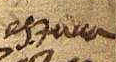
estaua
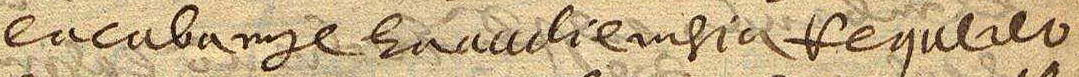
e acabamte ha audiemsia Requereo
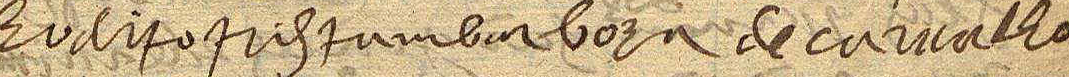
ho dito tristam barboza de carualho
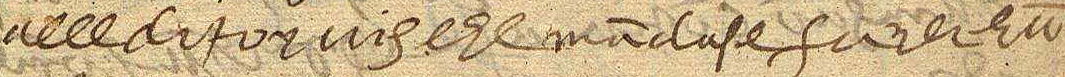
a ele dito yuis lhe mādase fazer hū
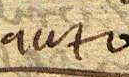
auto
